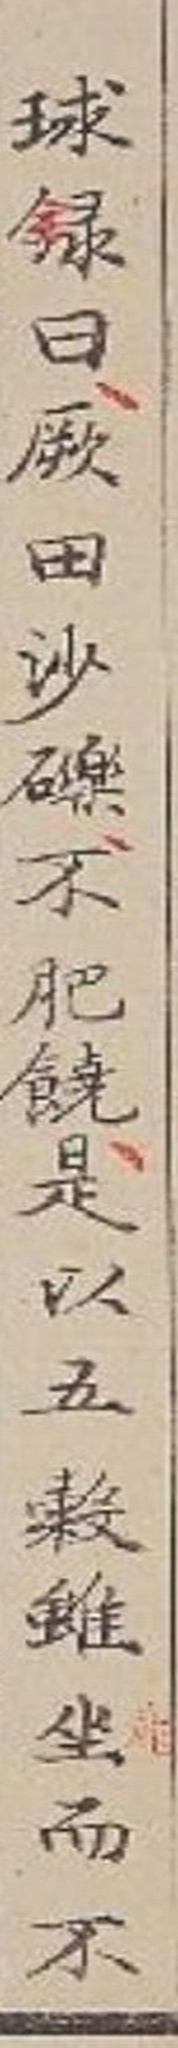球録曰、厥田沙礫、不肥饒、是以五穀雖坐産而不
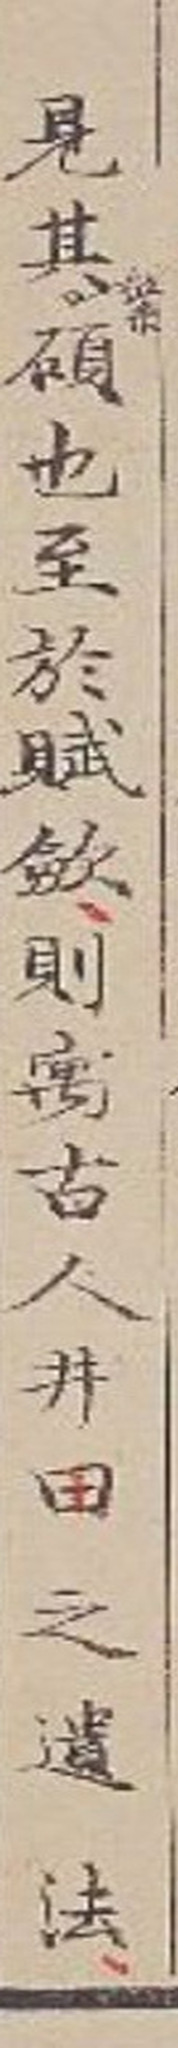見其碩也至於賦歛、則寓古人井田之遺法、
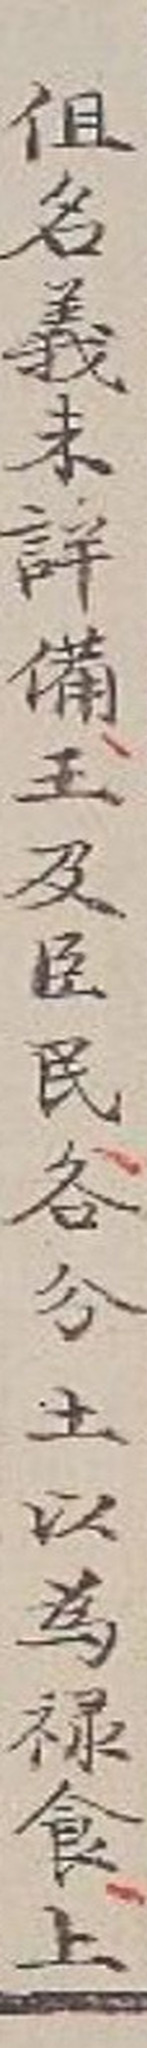但名義未詳備、王及臣民、各分土以為禄食、上
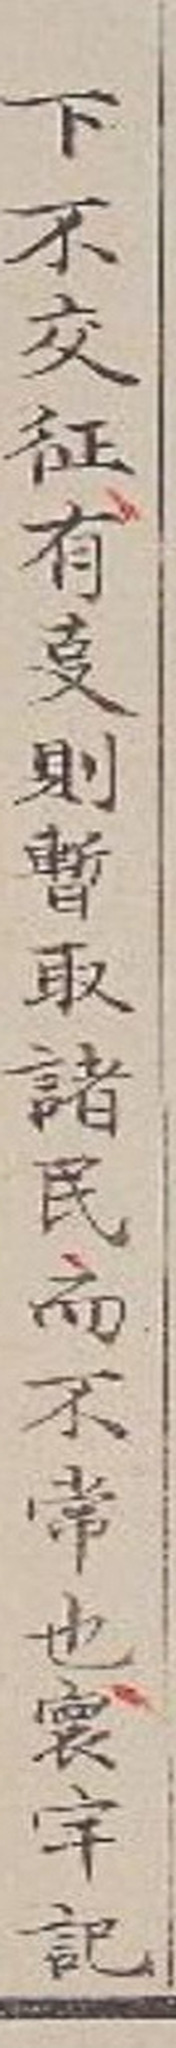下不交征、有事則暫取諸民、而不常也、寰宇記
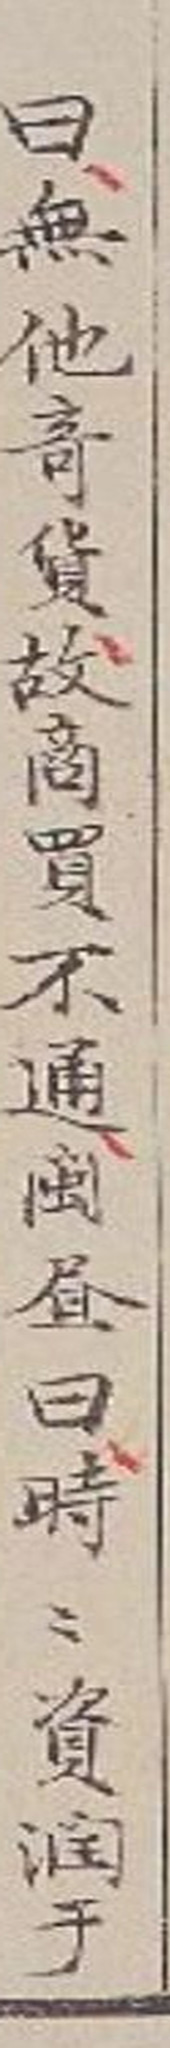曰、無他奇貨、故商買不通、閩昼曰、時々資潤于
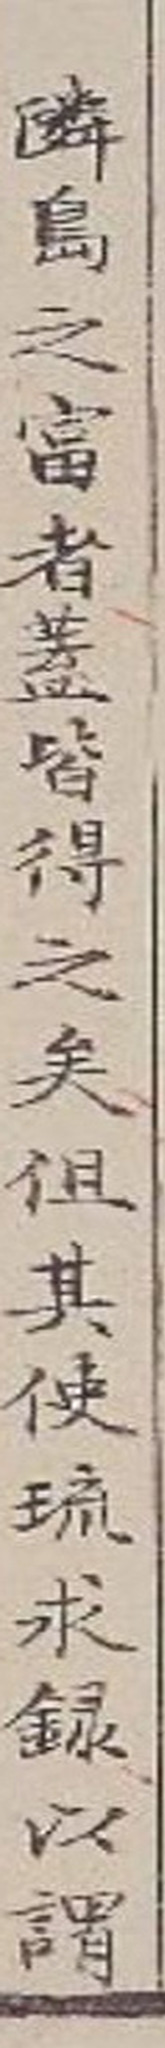隣島之富者、蓋皆得之矣、但其使琉求録以謂
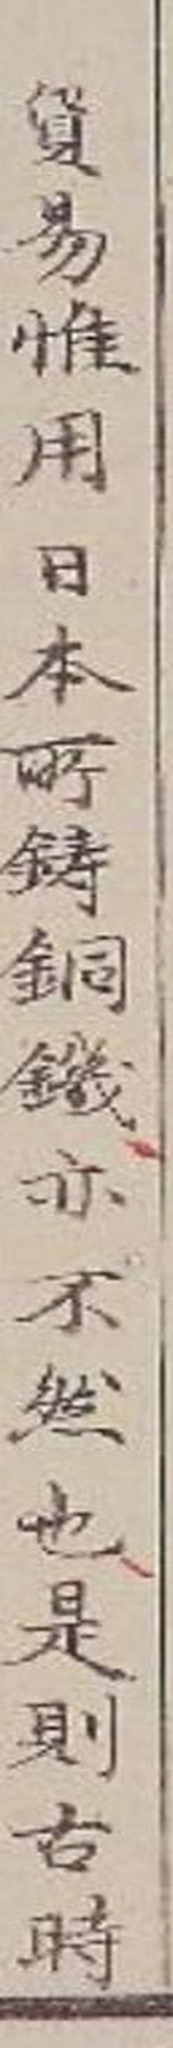貿易惟用日本所鋳銅、亦不然也、是則古時
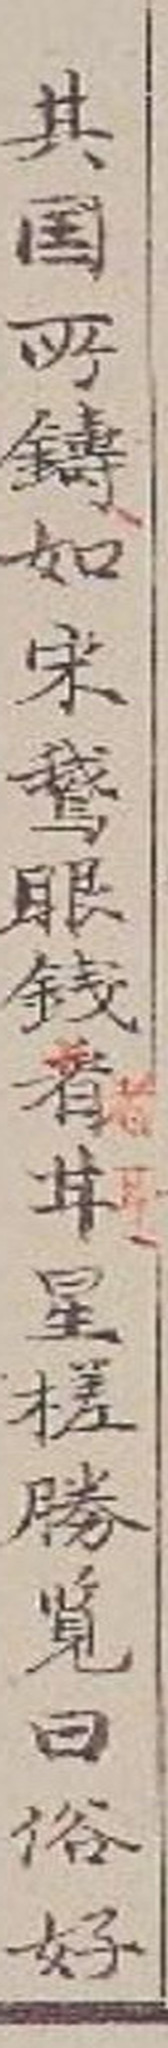其国所鋳、如宋鵝眼銭着者耳星槎勝覧曰俗好
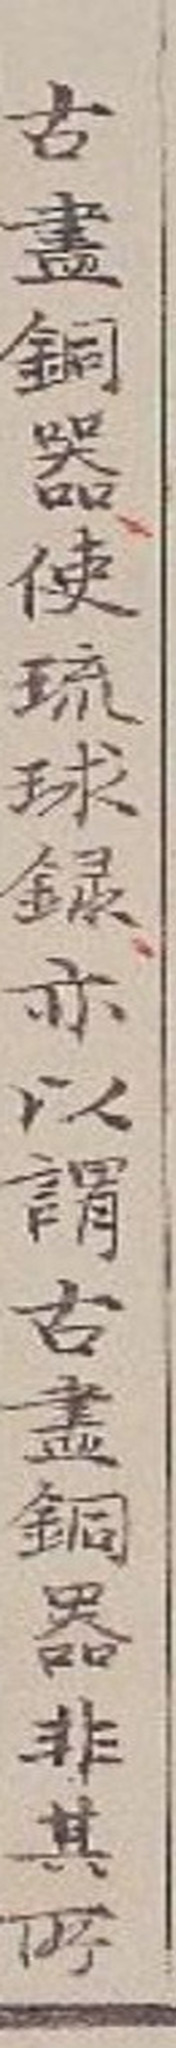古銅器、使琉球録、亦以謂古銅器非其所
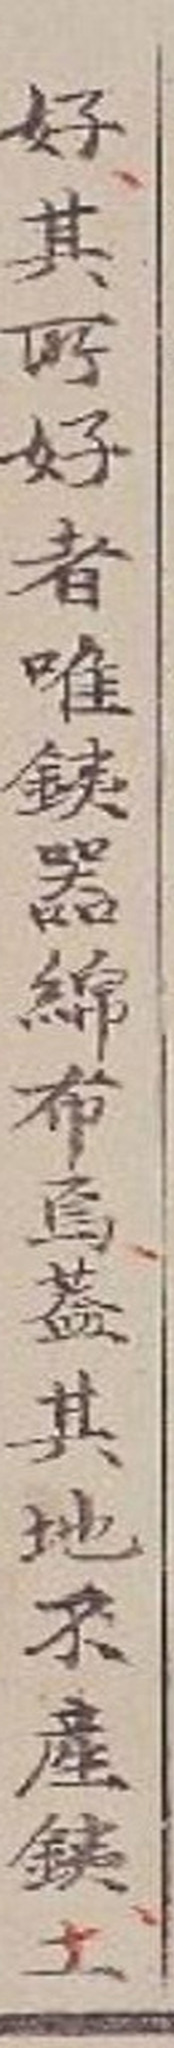好、其所好者唯鉄器綿布焉、蓋其地不産鉄、土
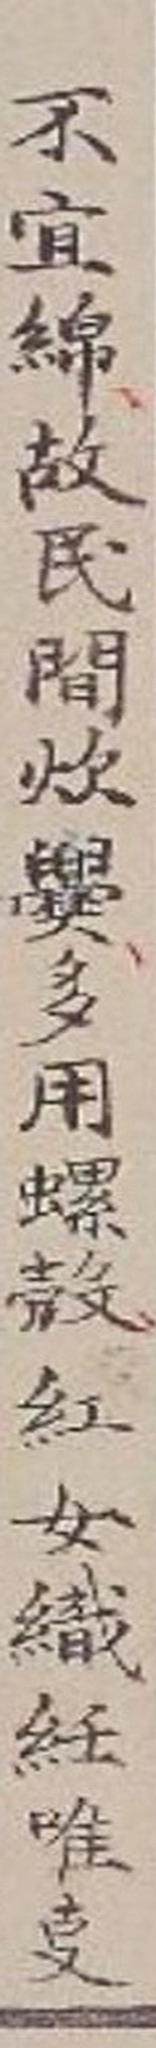不宜綿、故民間炊爨、多用螺殻、紅女織紝唯事
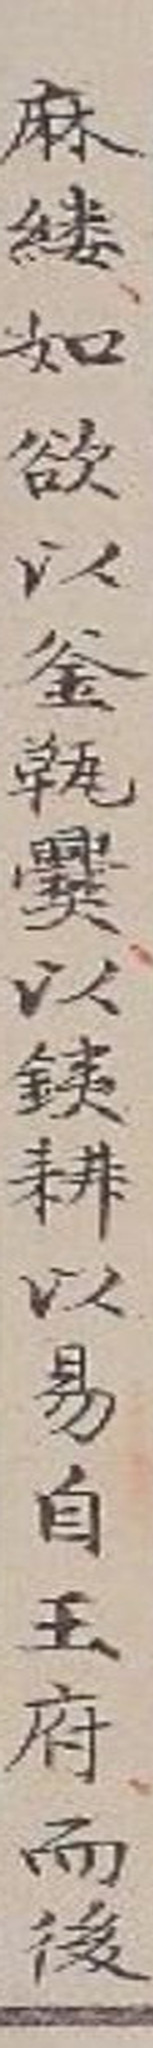麻縷、如欲以釜爨、以鉄耕必易自王府、而後

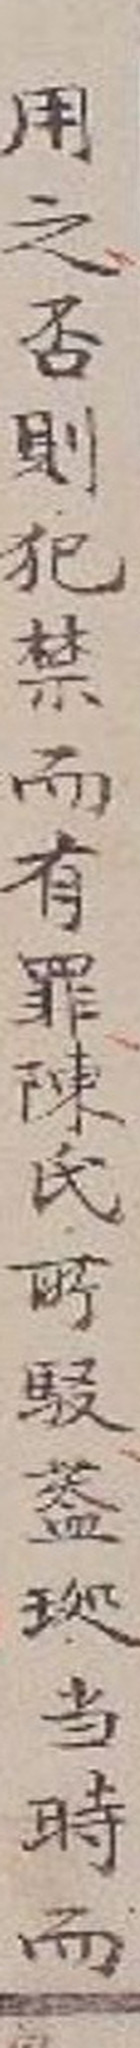用之、否則犯禁而有罪、陳氏所駁、蓋当時而
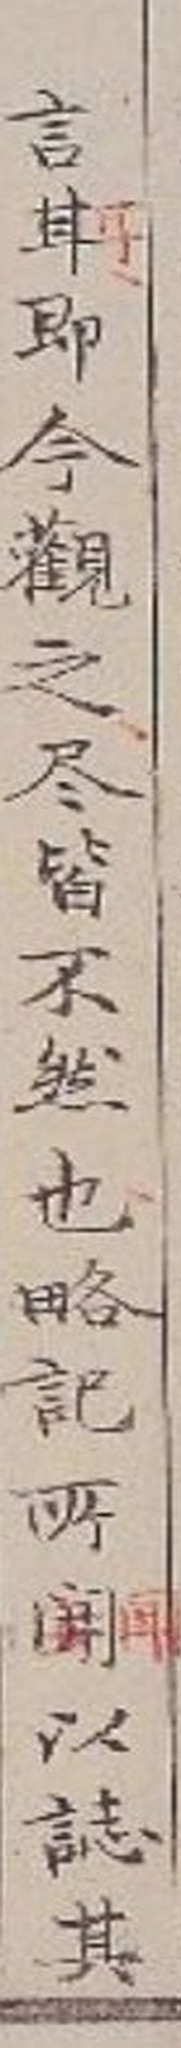言耳、即今観之、尽皆不然也、略記所開聞以誌其
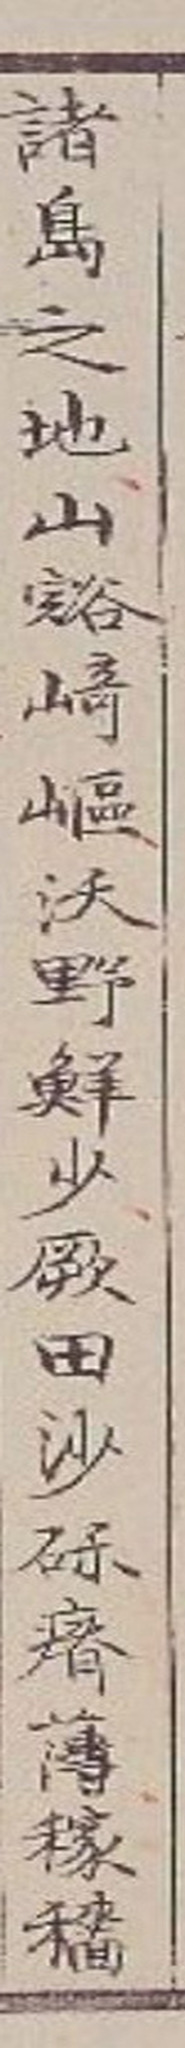諸島之地、山崎嶇、沃野鮮少、厥田沙礫瘠薄、稼穡
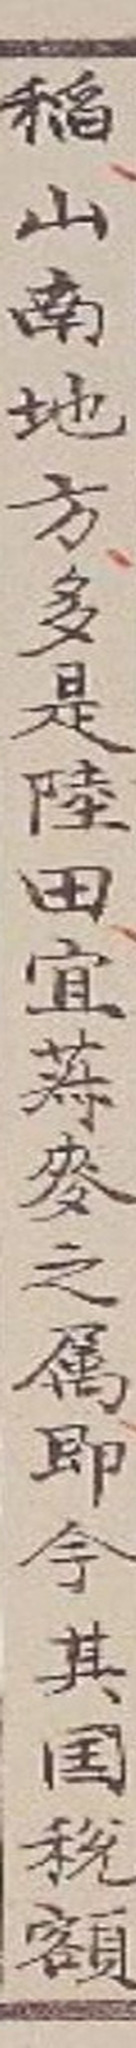稲、山南地方、多是陸田、宜麦之属、即今其国税額
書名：南島志 全
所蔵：University of the Ryukyus Library
